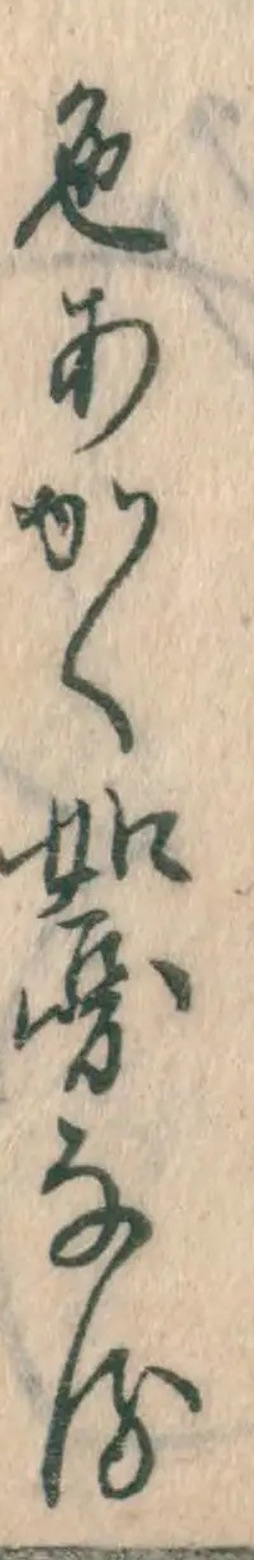色あかく如図なる
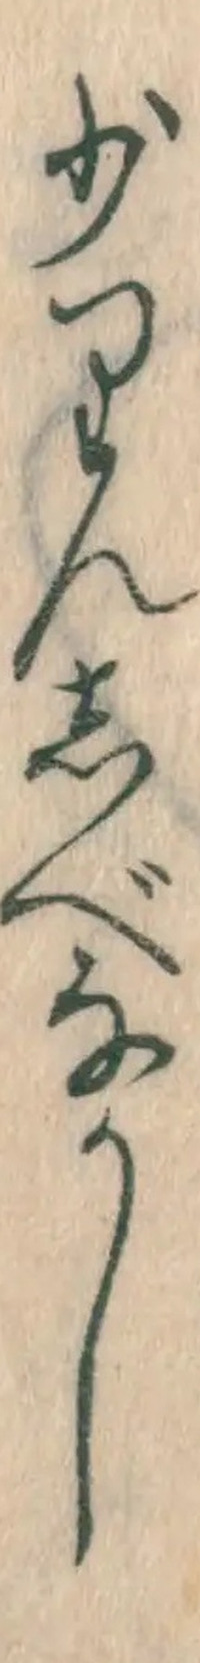少りんしべなかし

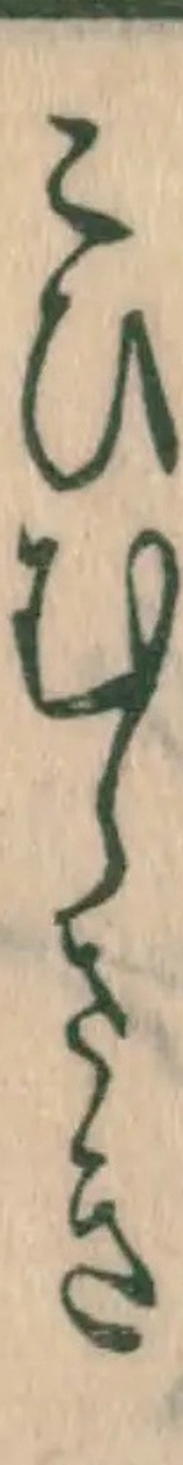こひむらさき
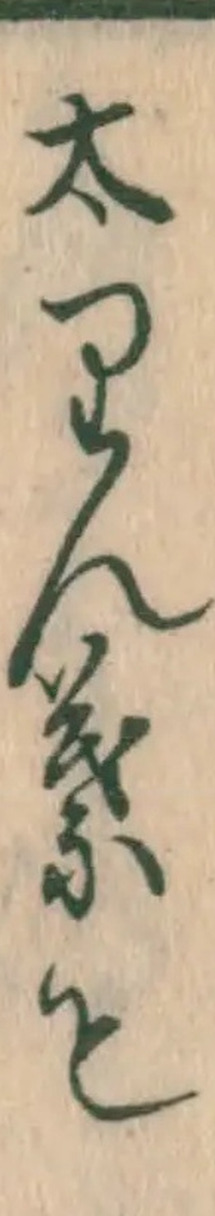太りん葉も
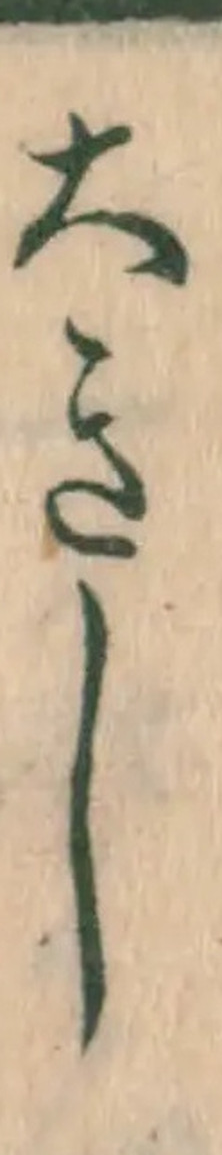大きし
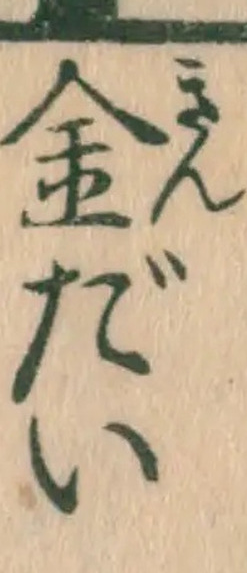金だい
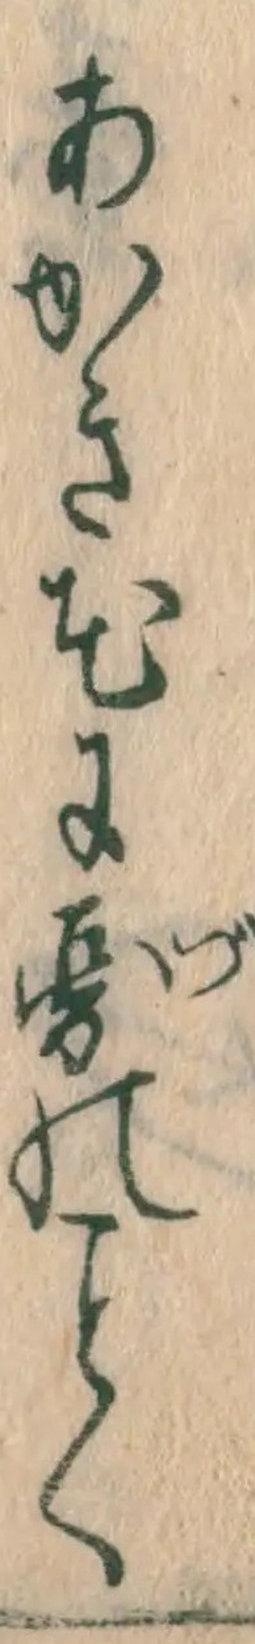あかき花に図のことく
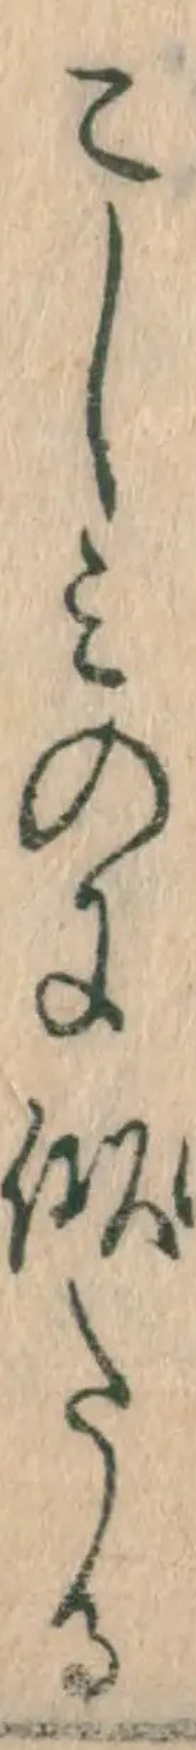こしみのに似たる
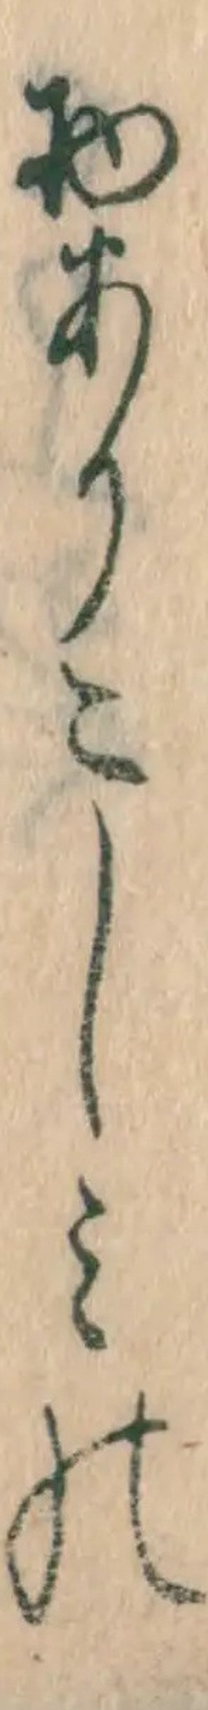物ありこしみの
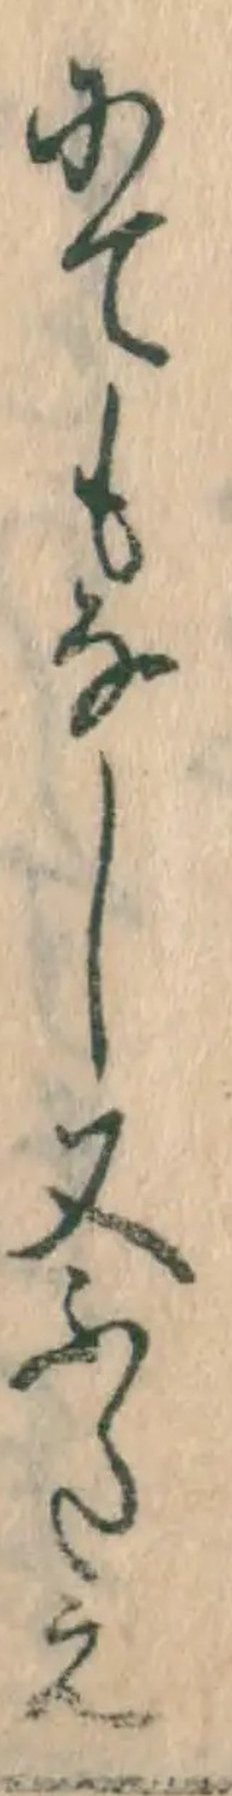にてもなし又ふたえ

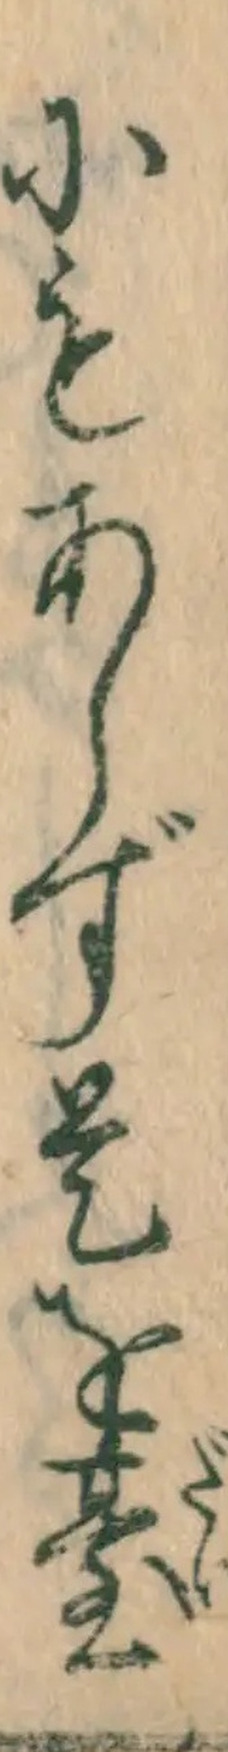にもあらず是を臺
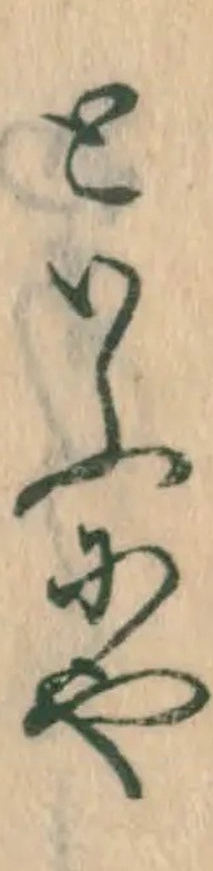といふにや
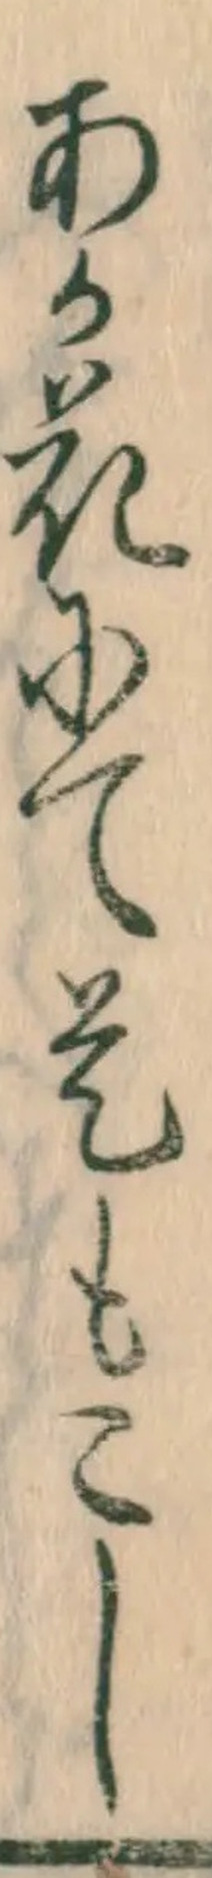あか花にて是もこし
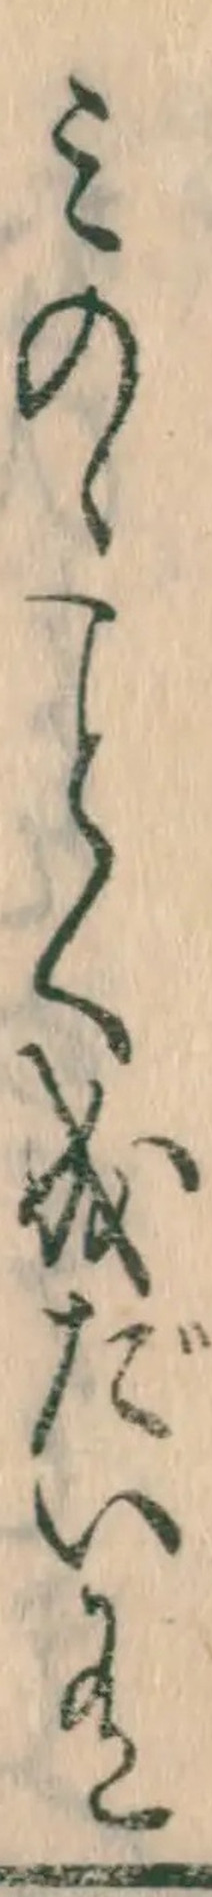みのゝことく成だい有
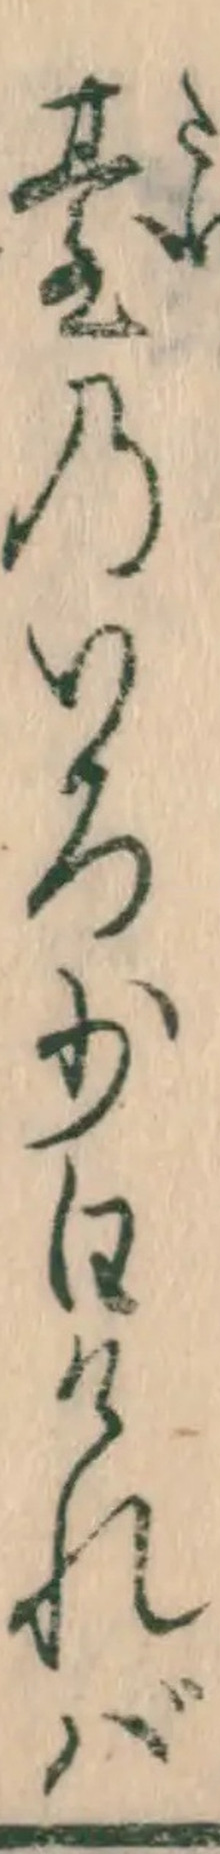臺のいろ少白ければ
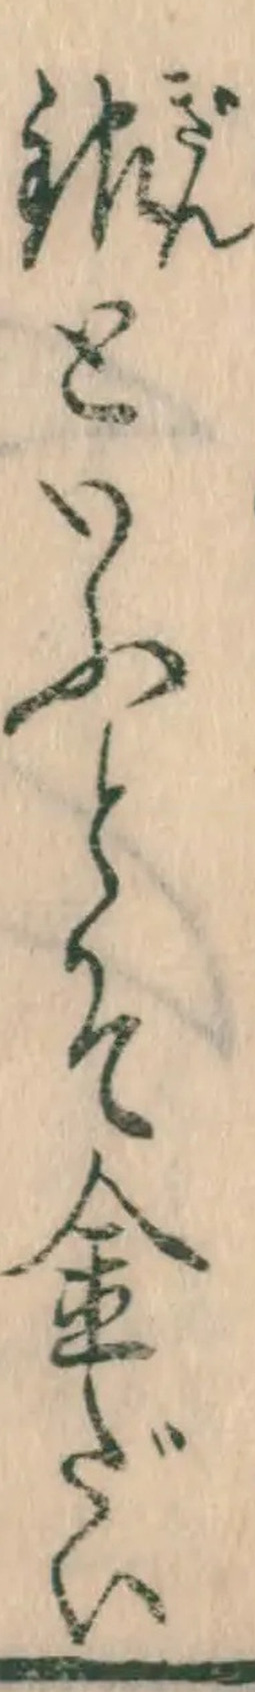銀といふとそ金だい
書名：錦繍枕 5巻. [1]
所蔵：国立国会図書館 National Diet Library, JAPAN
